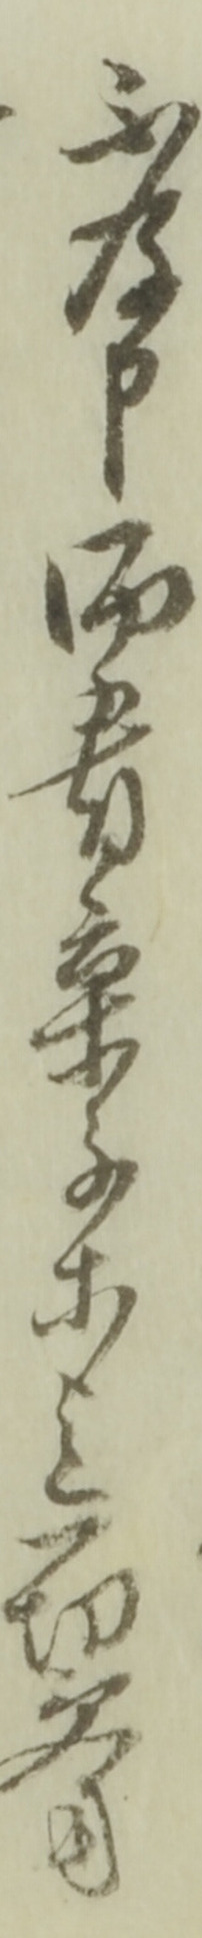不及申酒肴菓子等迄一切受用
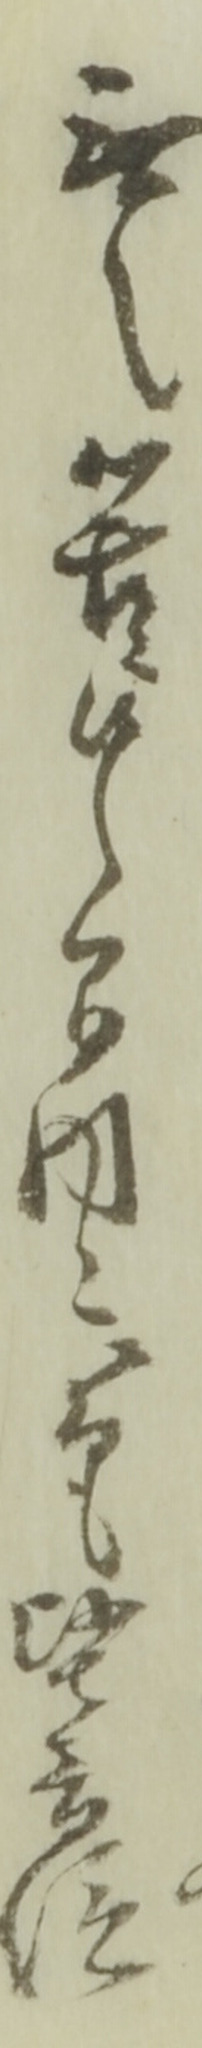無之筈二候之間内々二而も堅音信
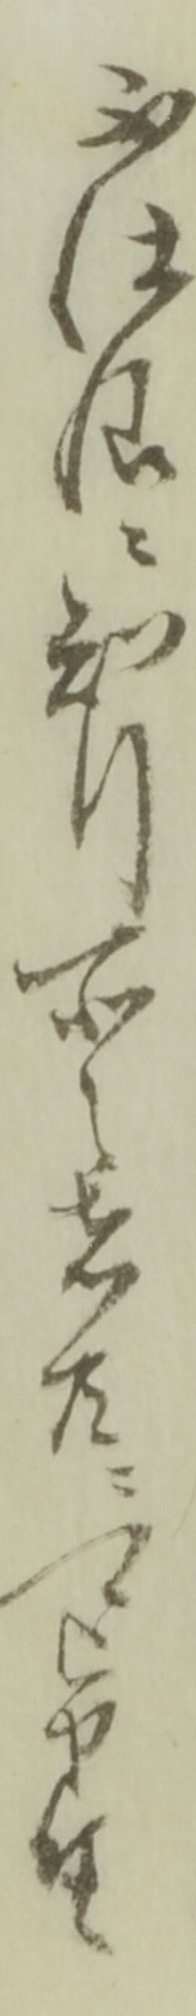不仕様二知行候所之者共二可被申付候
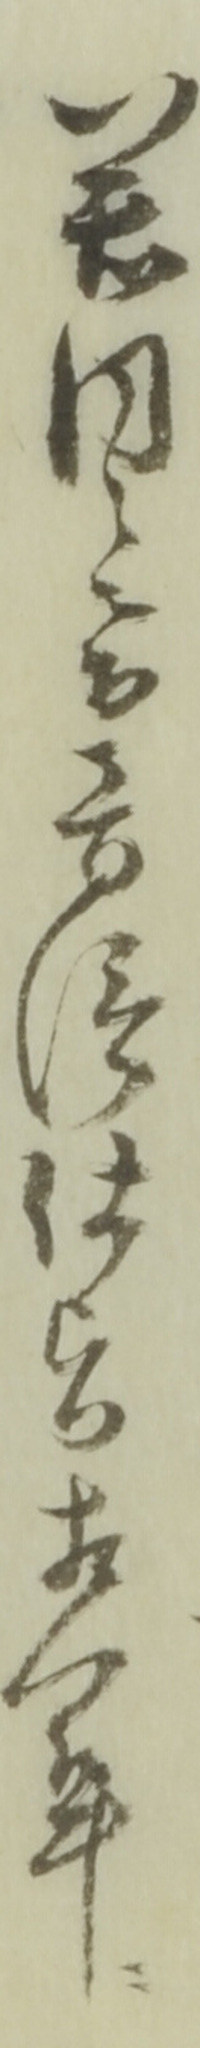若内々二而音信仕旨相聞二
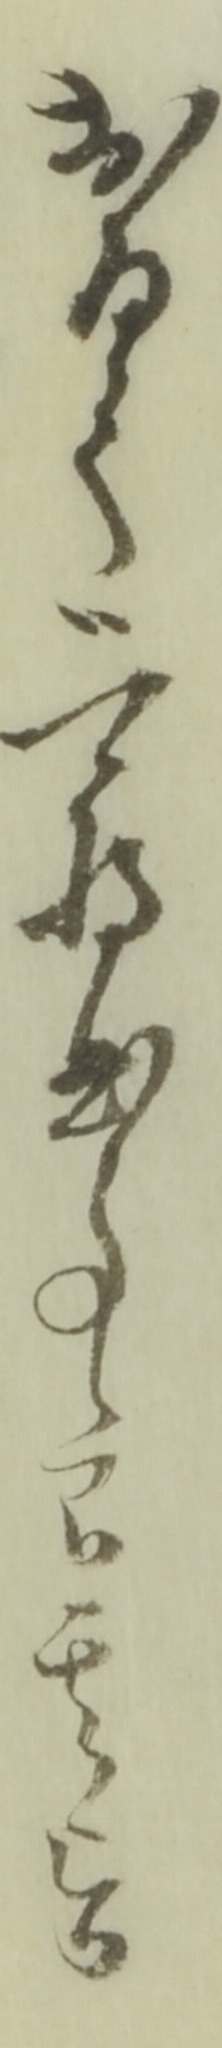おいてハ可為事候間其旨
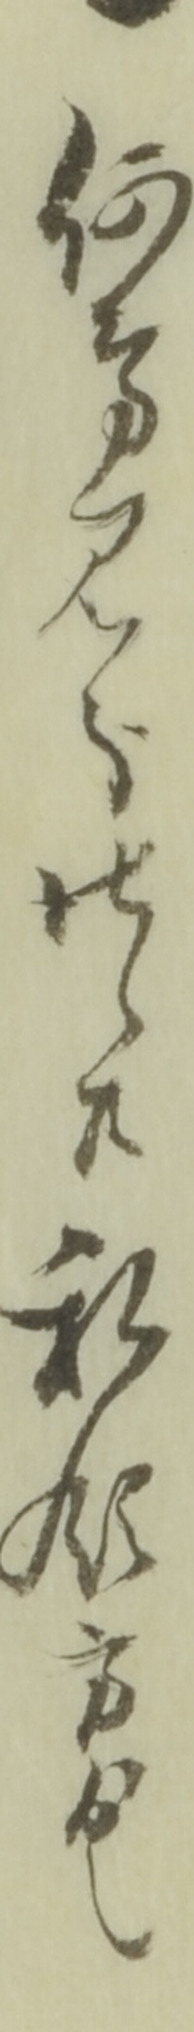一何方見分仕候共私領方より之
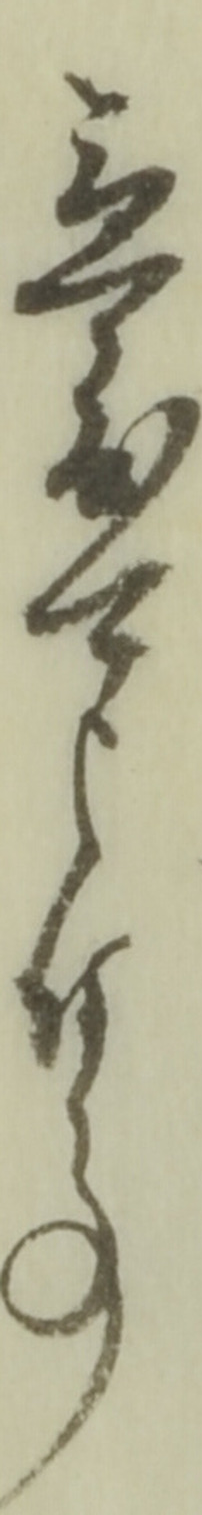急度可申付く事
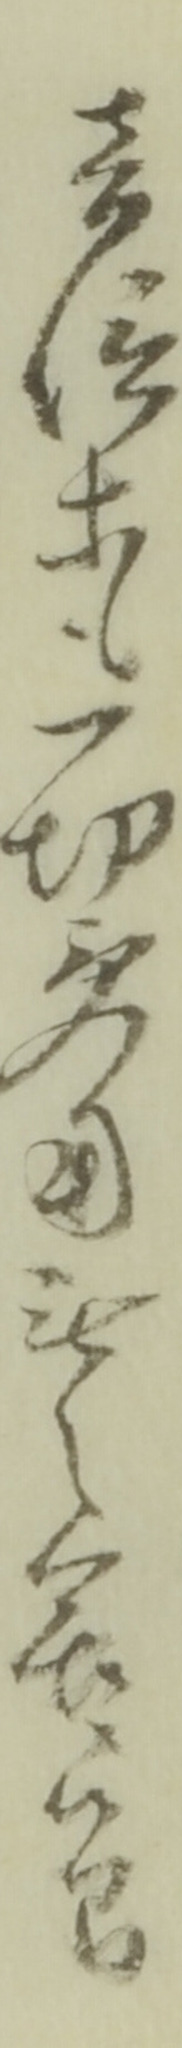音信等も一切受用無之筈二候間
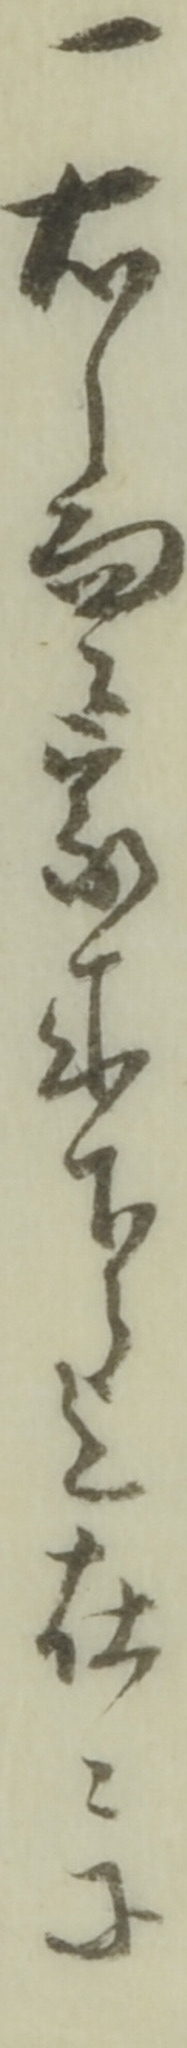一右之面々家来下々迄在々尓
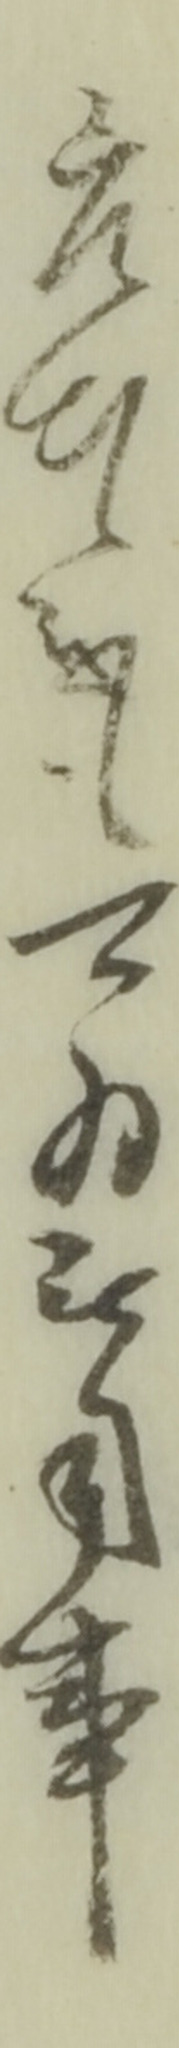差出候義茂可為無用事
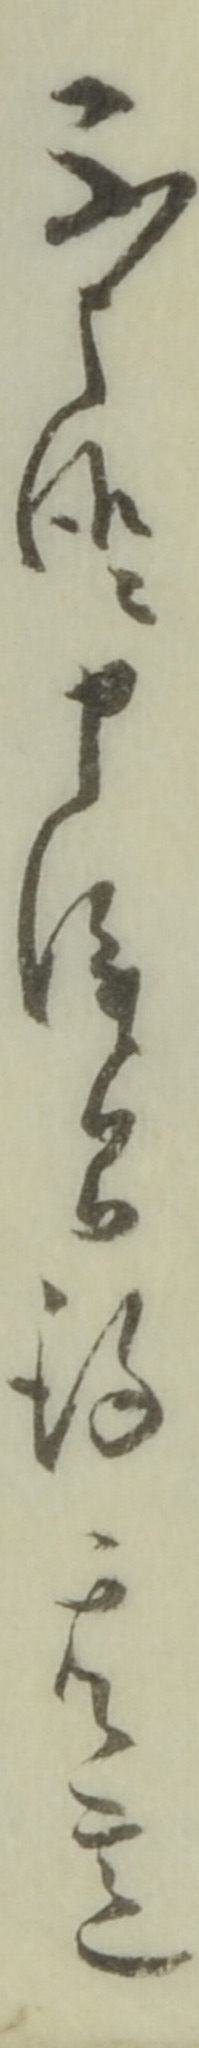不申様二申渡候間得其意

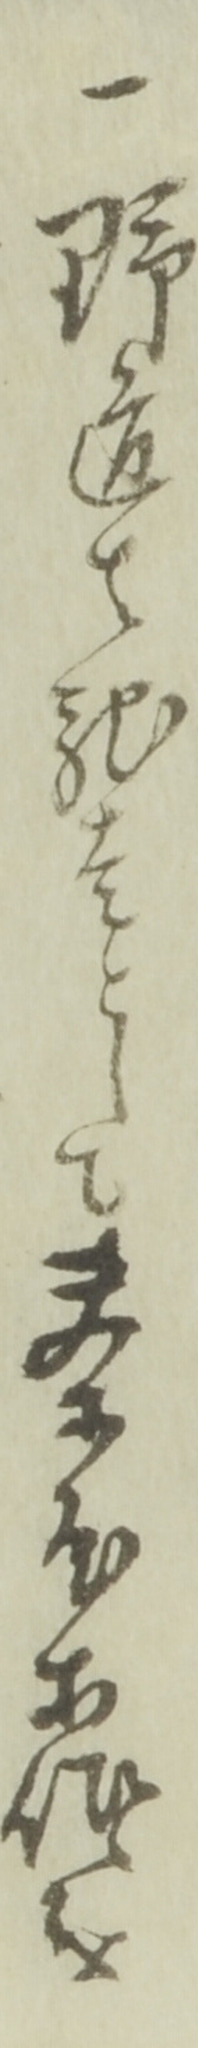一野道者馳走として夫等外等作候義
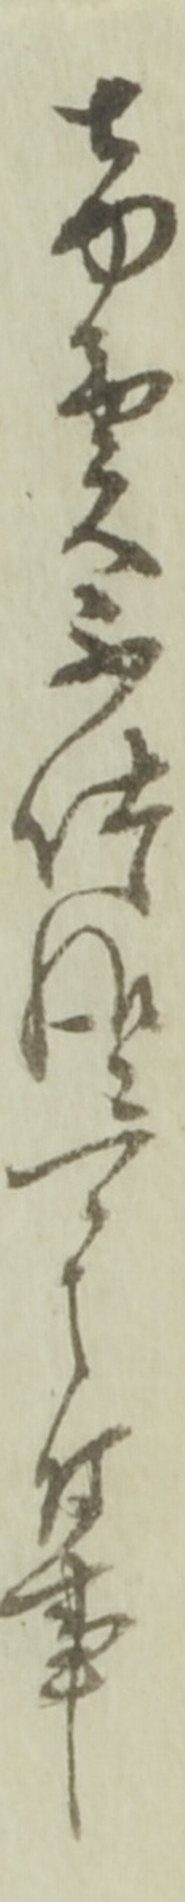商売不仕候様二可申付事
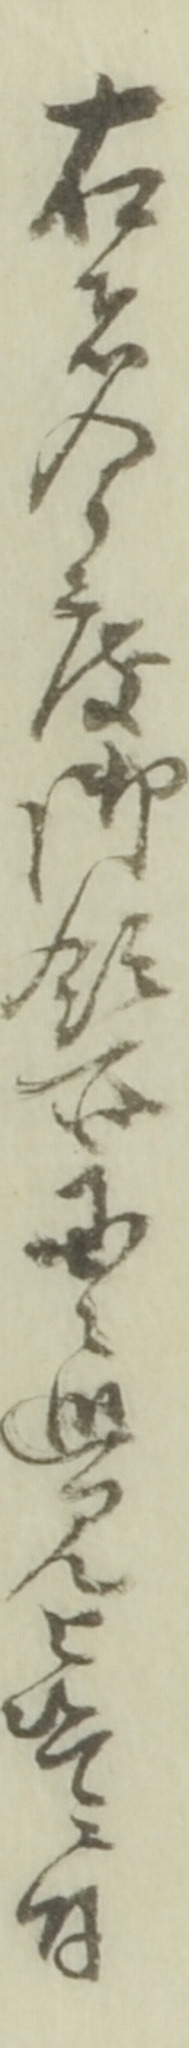右者今度御領所国二巡見被出候二付
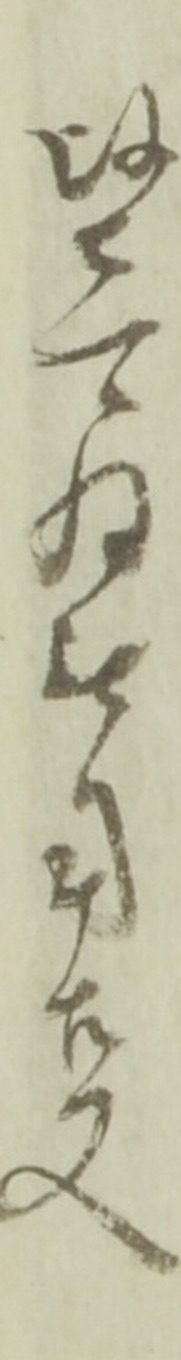堅可為無用事
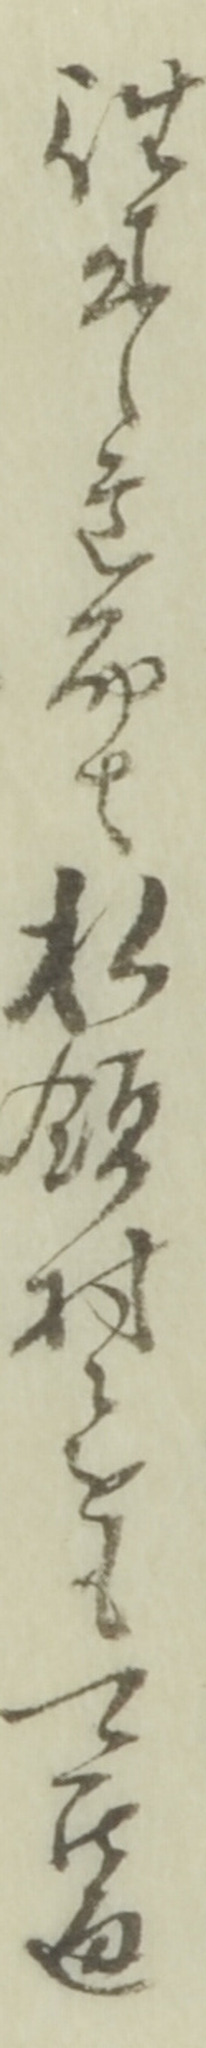往来候辺筋者私領村々をも可罷通
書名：御公儀様御領主様御触書控
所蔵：伊那市立高遠町図書館・合同会社AMANE
